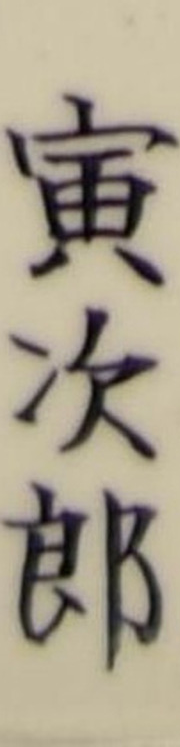寅次郎
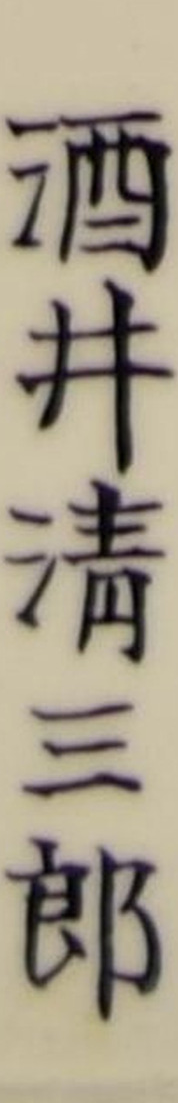酒井清三郎
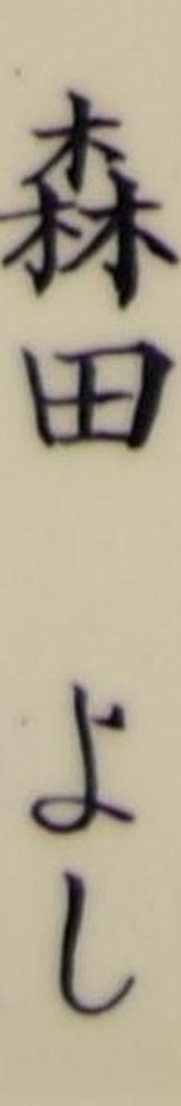森田よし
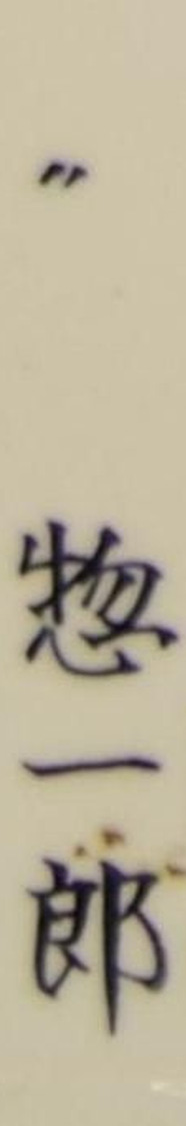惣一郎
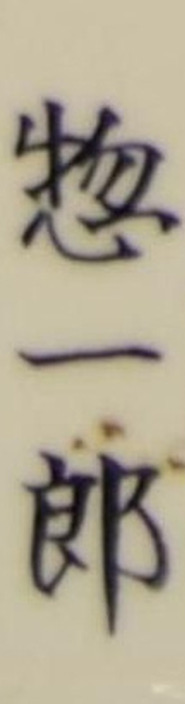惣一郎
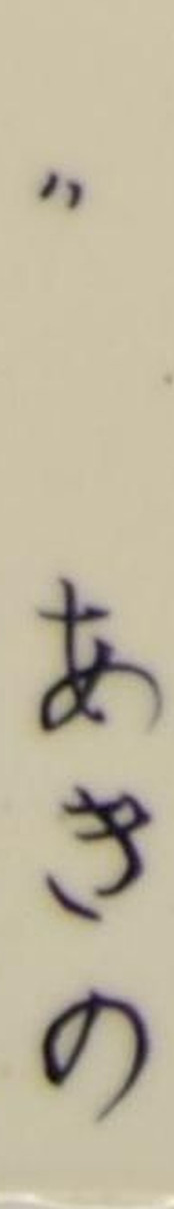あきの
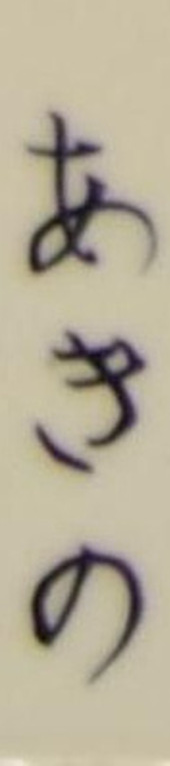あきの
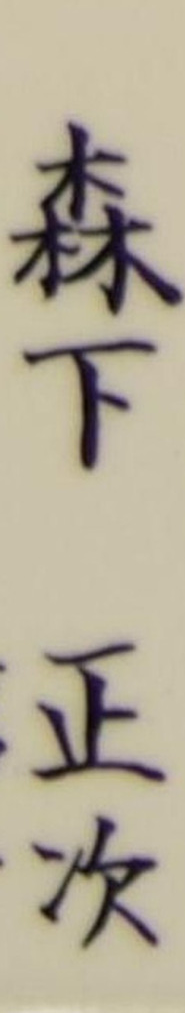森下正次

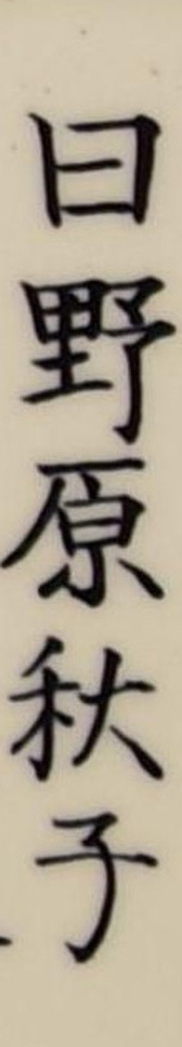日野原秋子
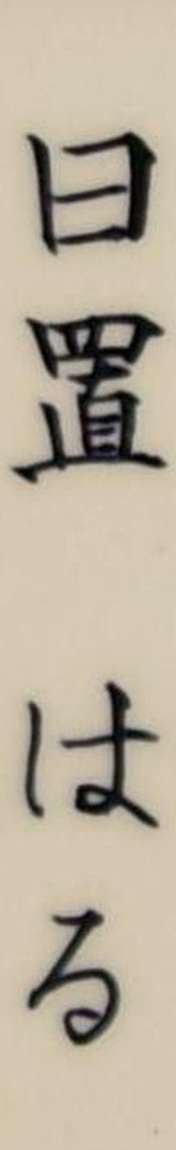曰置はる
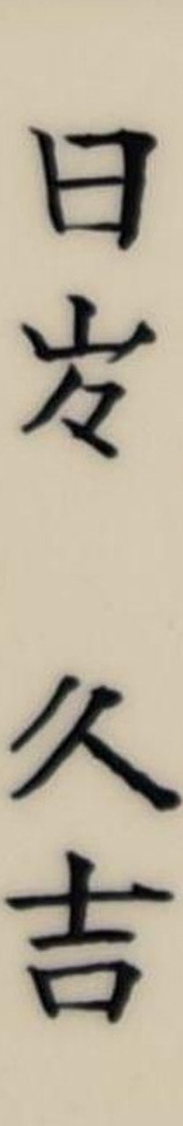日出久吉
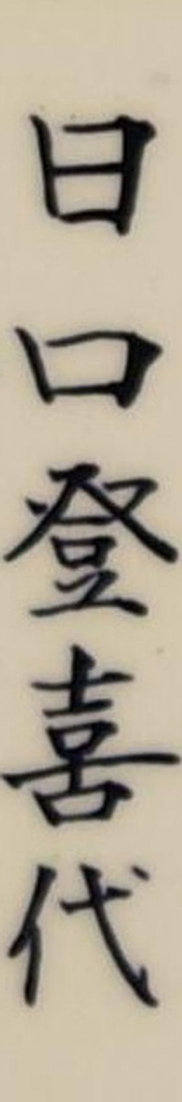日口登喜代
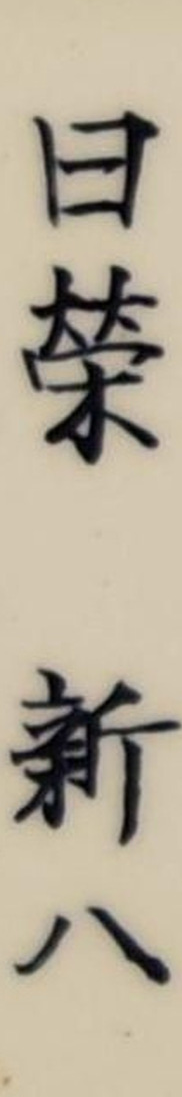日栄新八
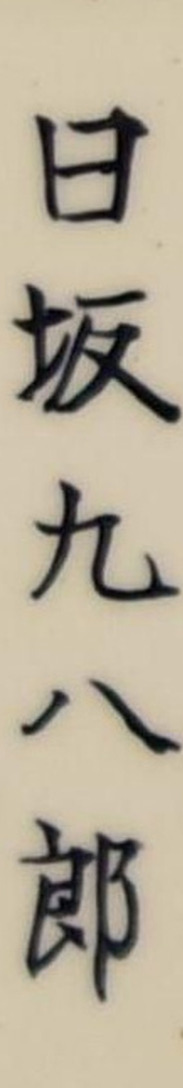日坂九八郎
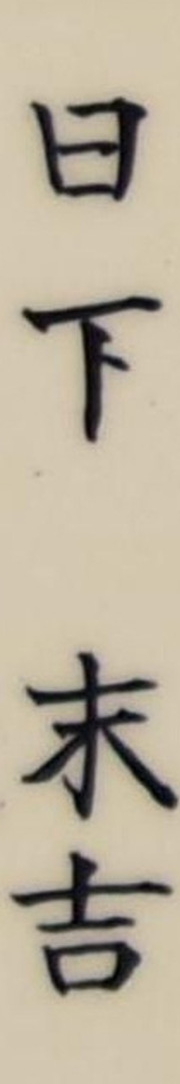日下未吉
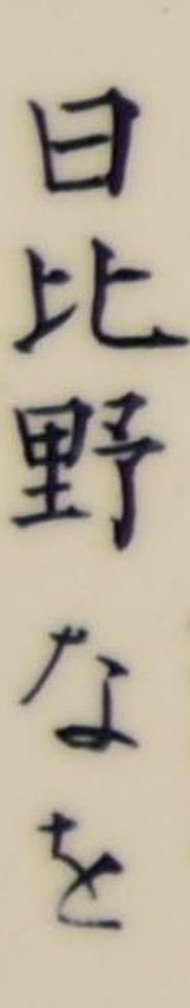日比野なを
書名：A~D
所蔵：koyasan kongobuji
